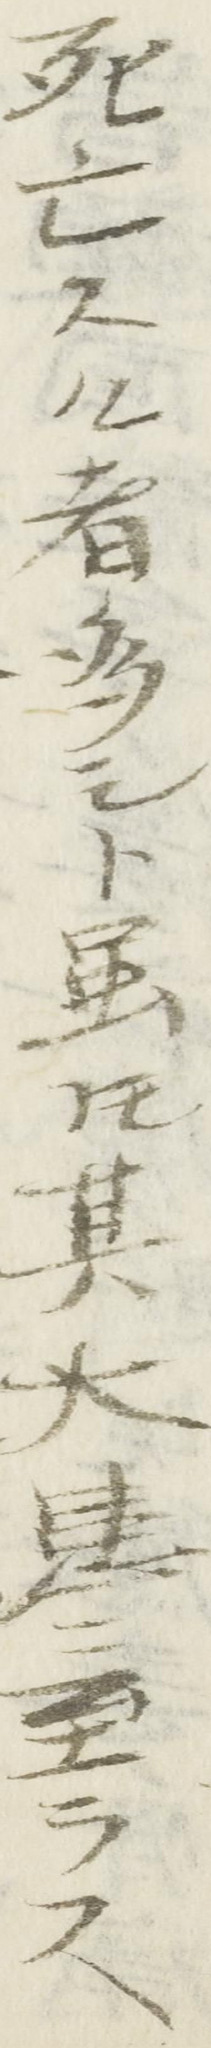死亡スル者多シト雖モ其大患ニ至ラス
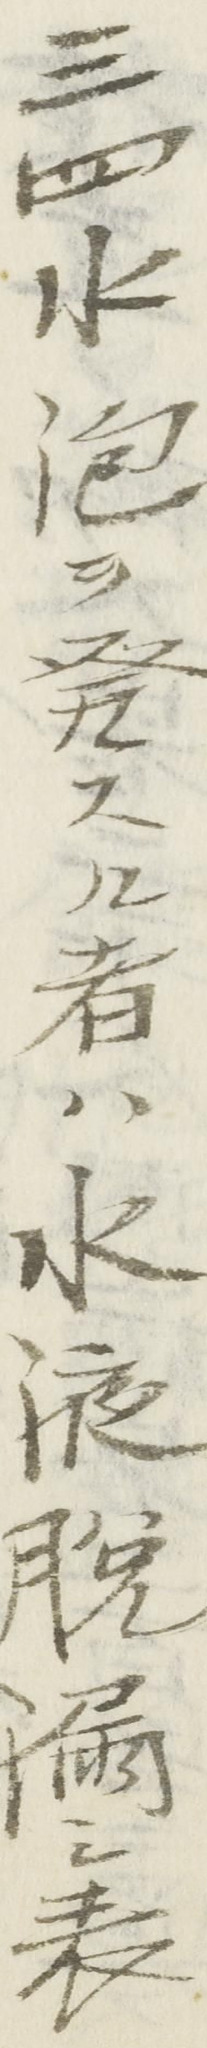三四水泡ヲ発スル者ハ水液脱漏シ表
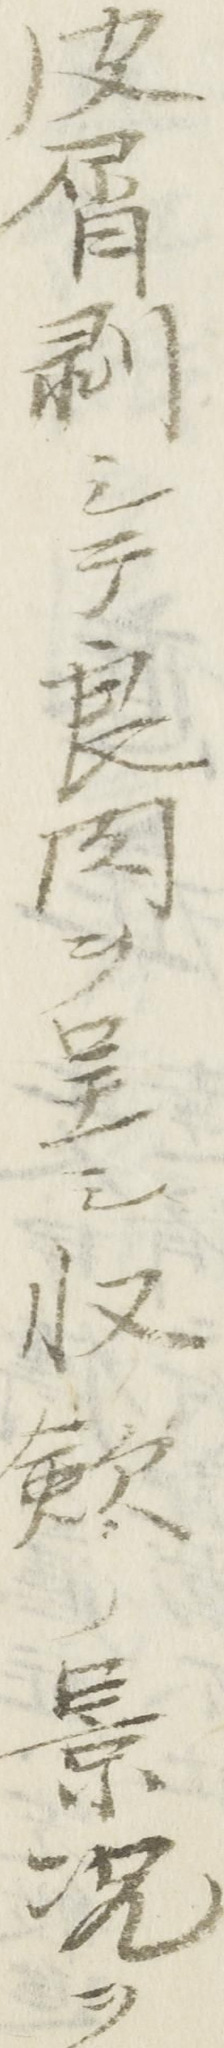皮屑剥シテ良肉ヲ呈シ収斂ノ景況ヲ
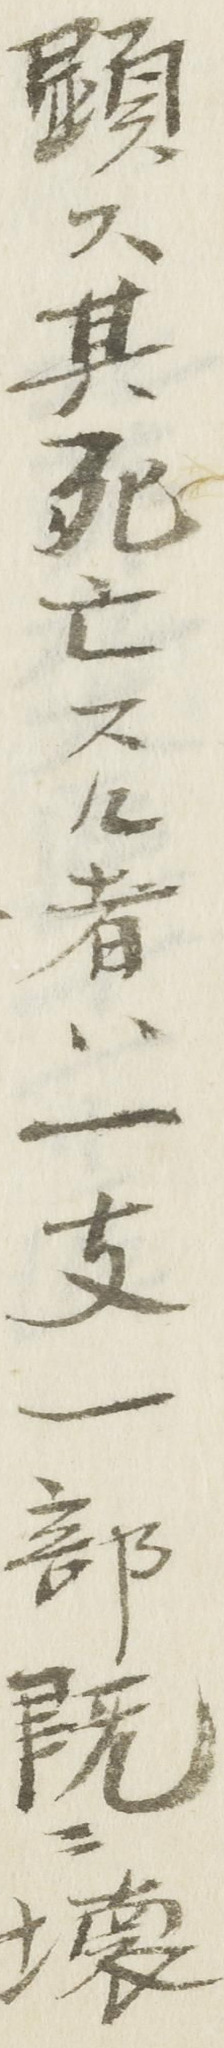顕ス其死亡スル者ハ一支一部既ニ壊
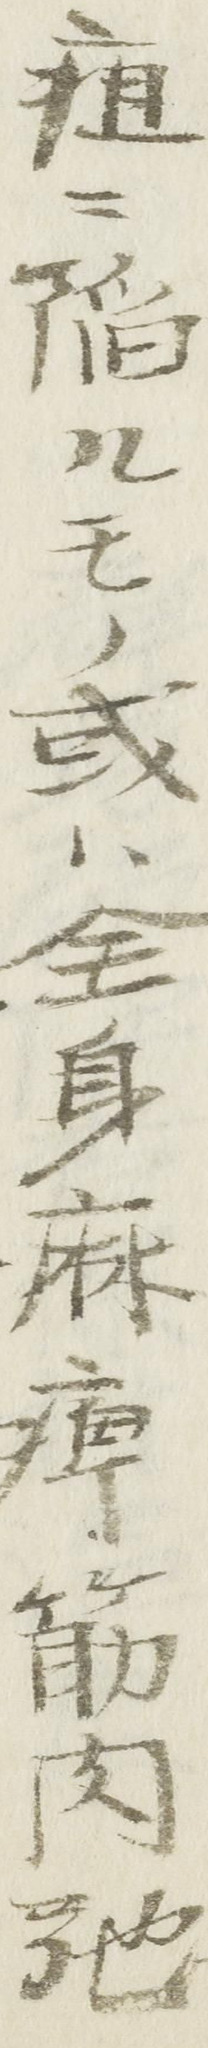疽ニ陥ルモノ或ハ全身麻痺筋肉弛
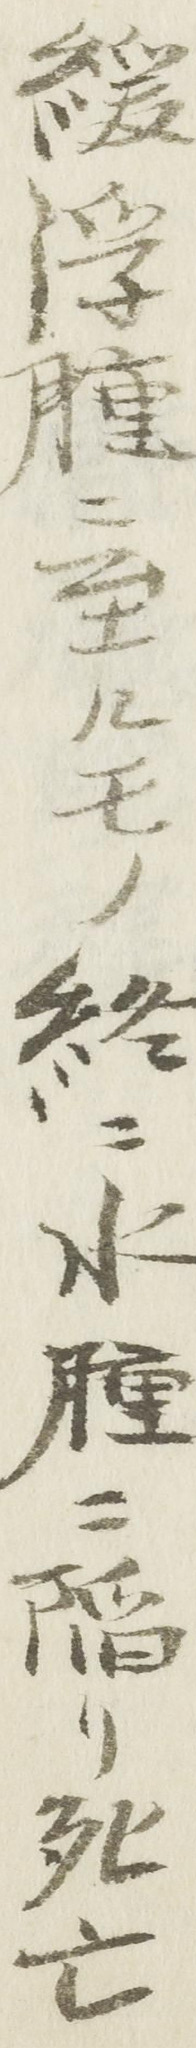緩浮腫ニ至ルモノ終ニ水腫に陥リ死亡
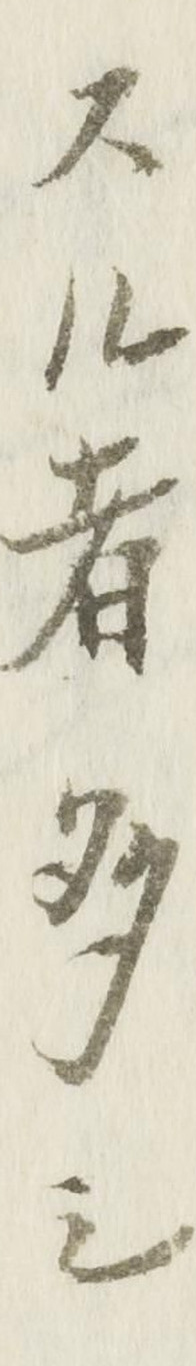スル者多シ

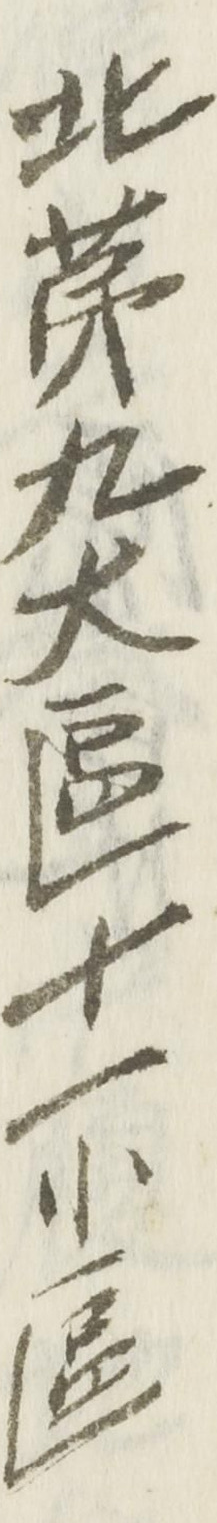北第九大区十一小区
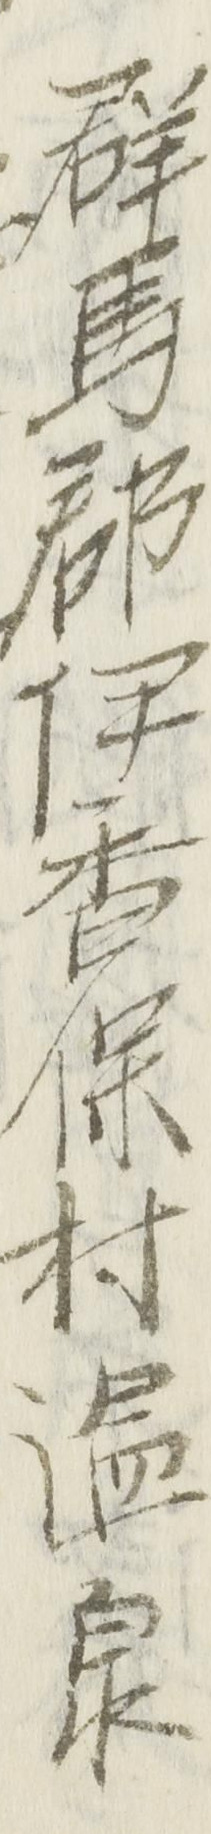群馬郡伊香保村温泉
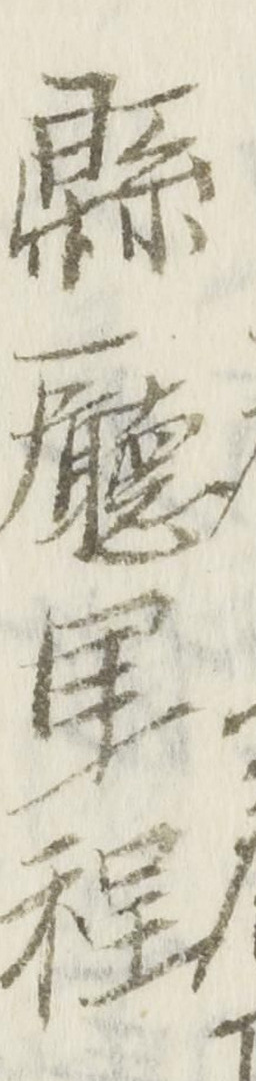県庁里程
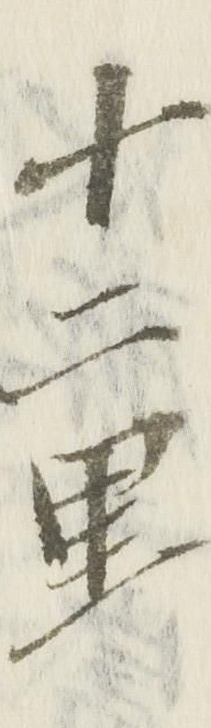十二里
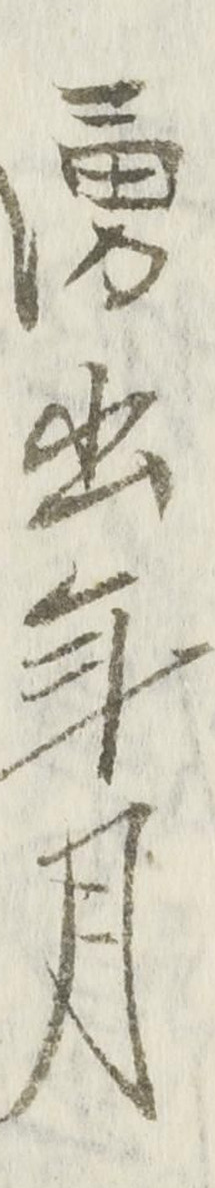湧出年月
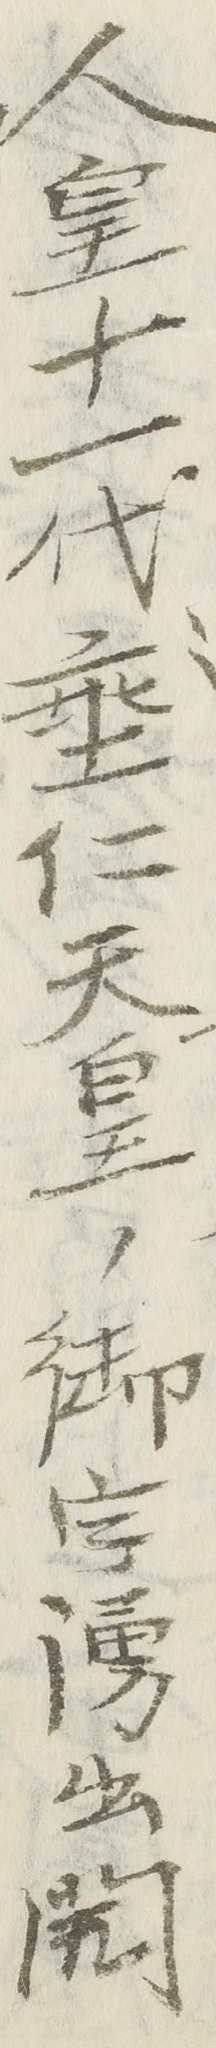人皇十一代垂仁天皇ノ御宇湧出開
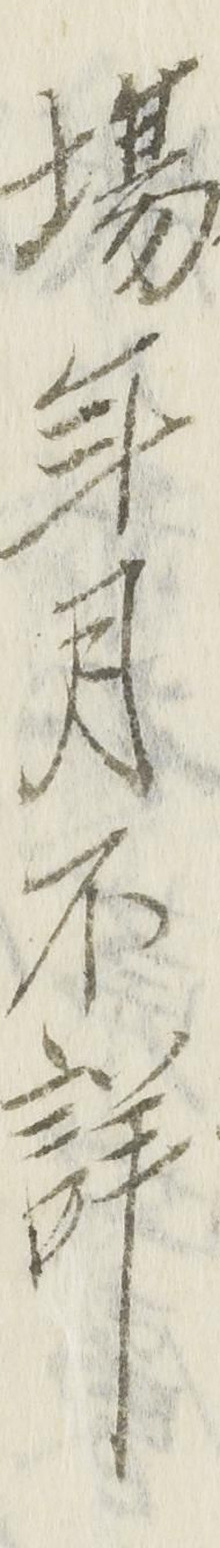場年月不詳
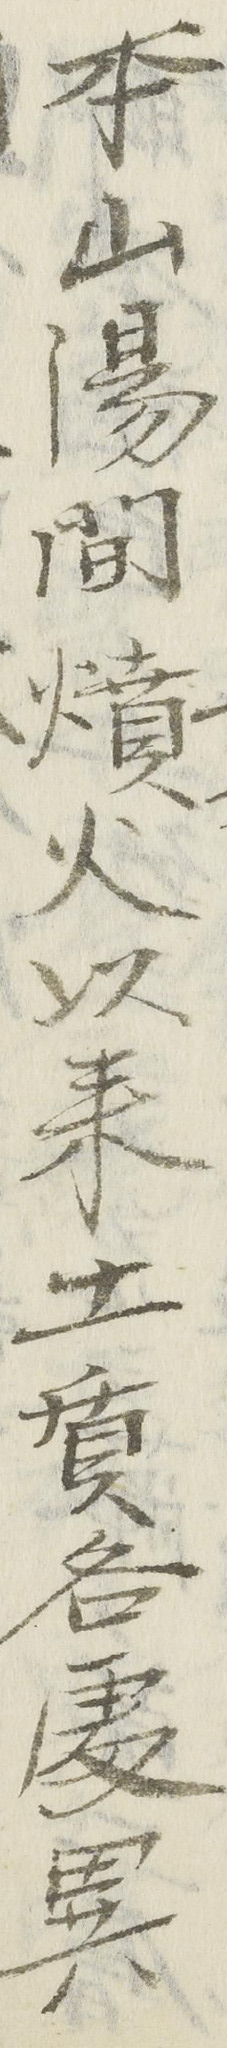本山湯間噴火以来土質各処異
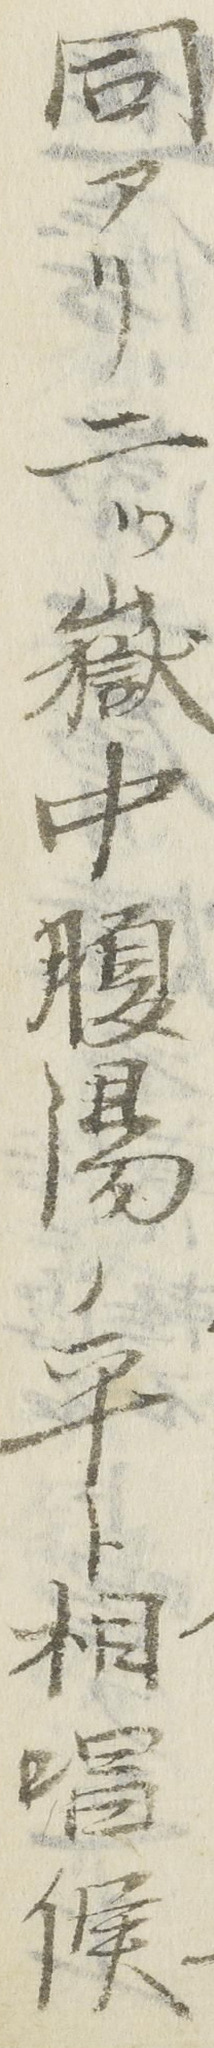同アリ二ツ嶽中腹湯ノ平ト相唱候
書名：温冷泉試験表
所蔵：東京大学地震研究所図書室 Earthquake Research Institute Library, The University of Tokyo, JAPAN
